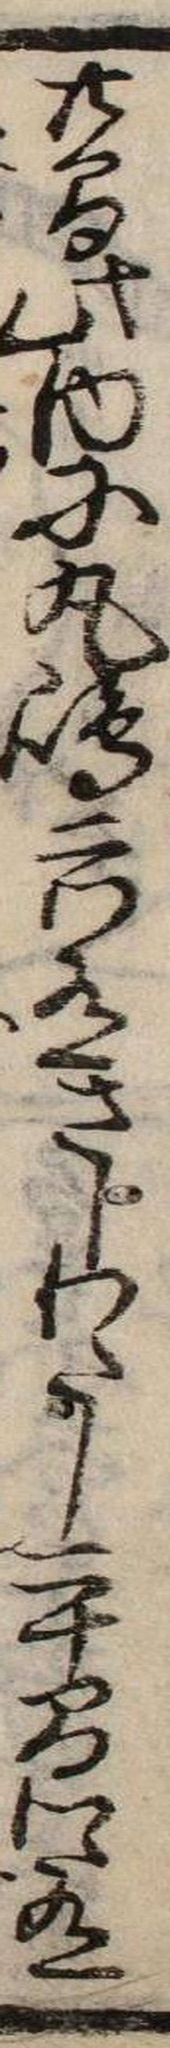廿間此内に丸嶋二つ有さしわたし二十間つつ有
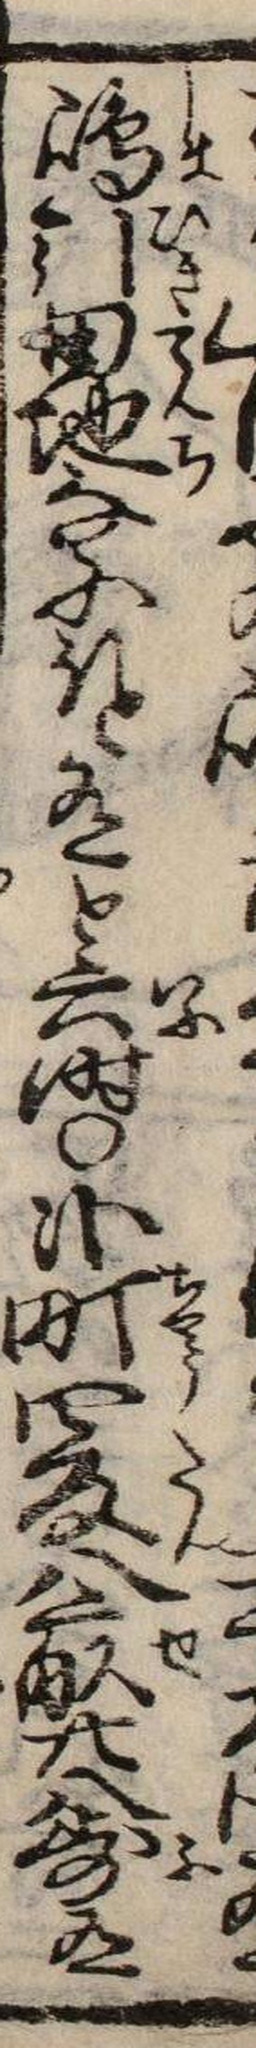島引田地なにほと有と云時○弐町四反八畝廿八歩有
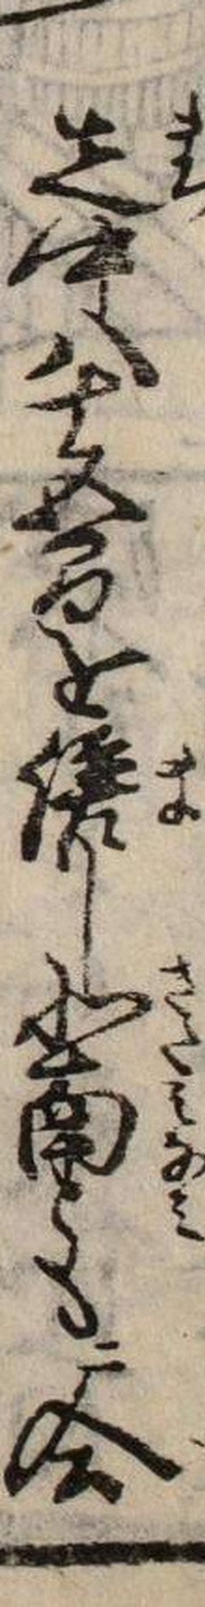先中八十五間を倍し北南共に合
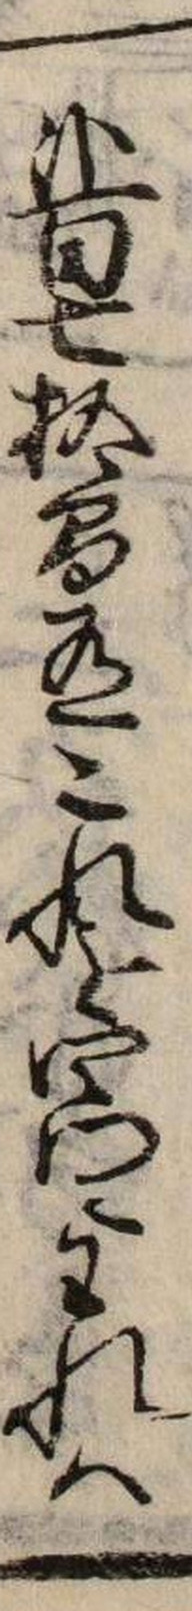弐百七拾間有これを四つにわれは
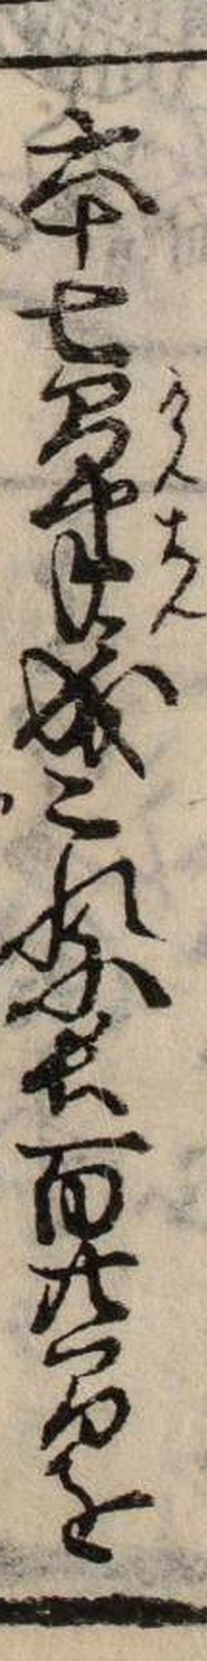六十七間半成これに長百廿間を
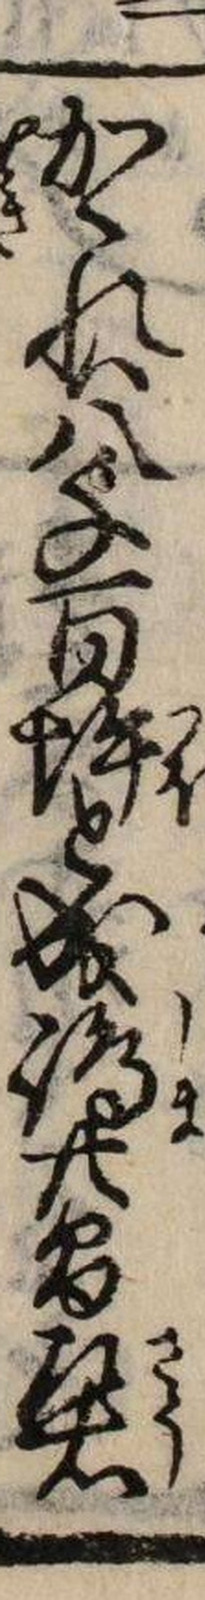かくれは八千百坪と成嶋廿間左右
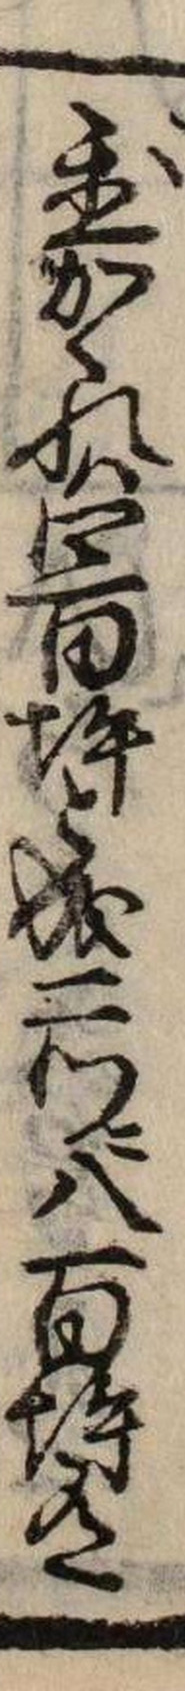置かくれは四百坪と成二つに八百坪有
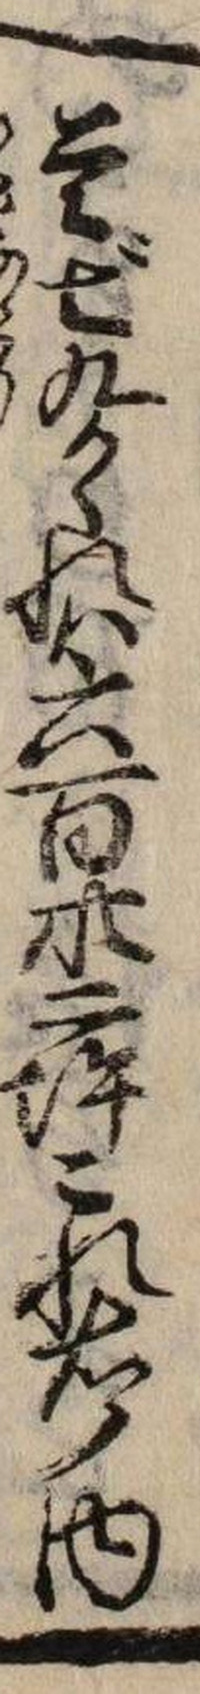是に七九かくれは六百卅二坪これ右の内
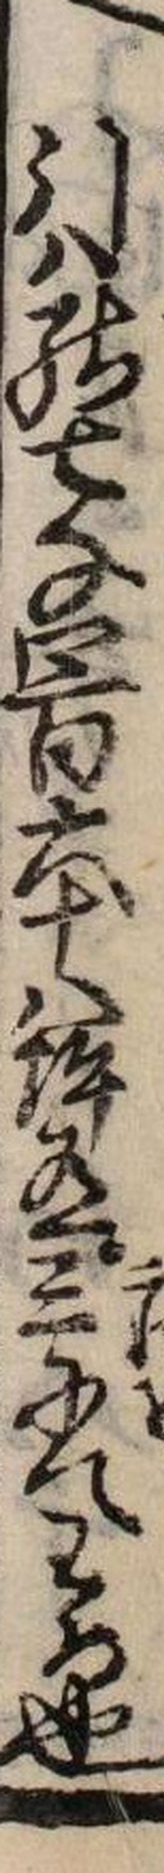引は残七千四百六十八坪有これを三にてわる也
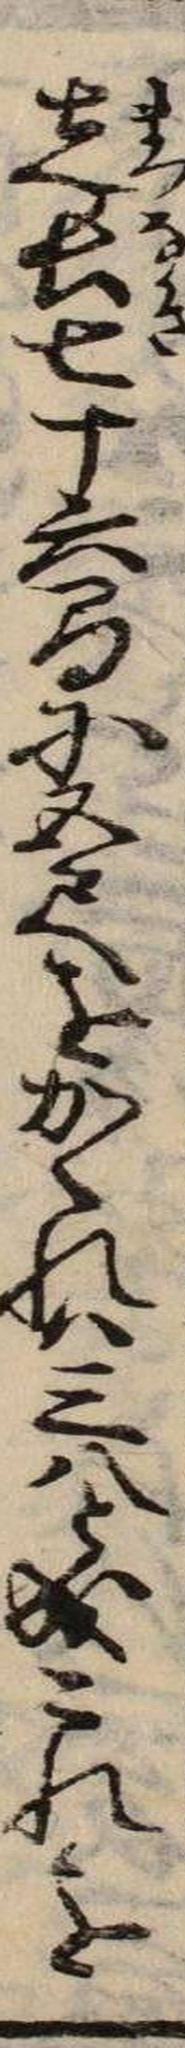先長七十六間に五尺をかくれは三八と成これを
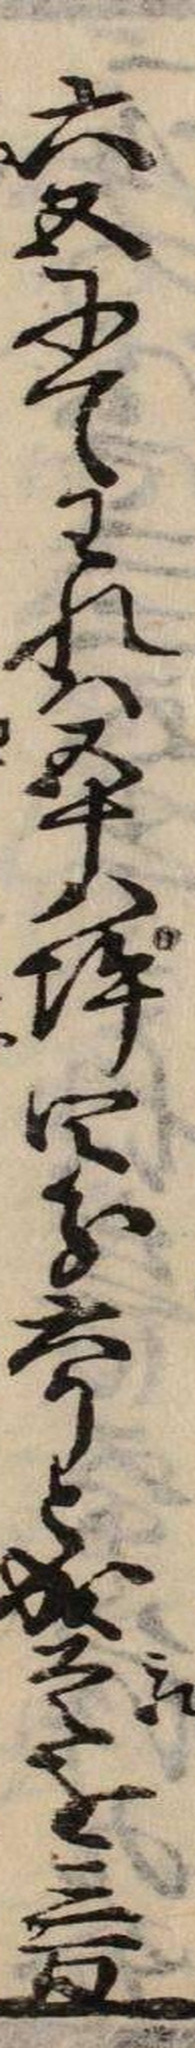六五にてわれは五十八坪四分六りと成是を三百
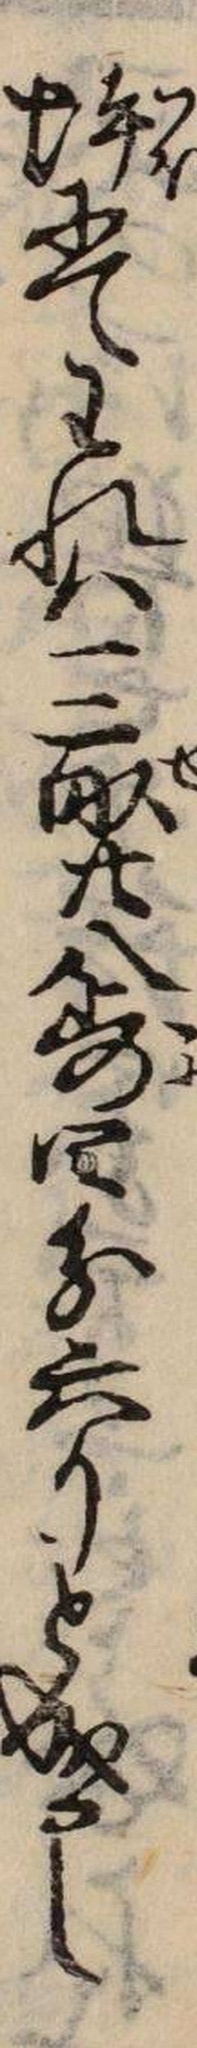坪にてわれは一畝廿八歩四分六りと成申候
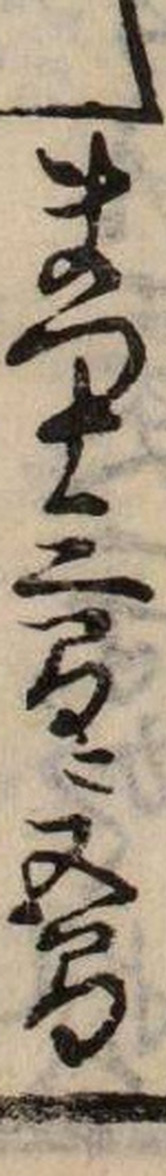まつ十三間に五間
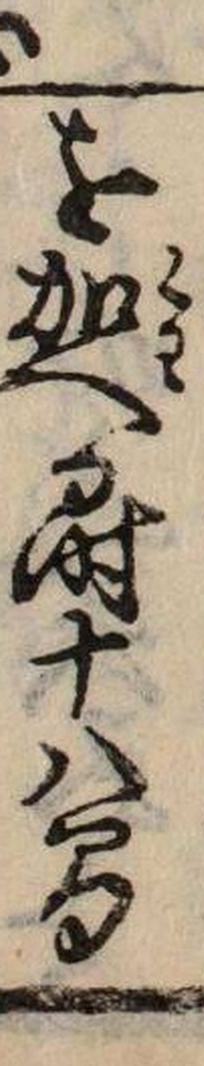を加へる時十八間
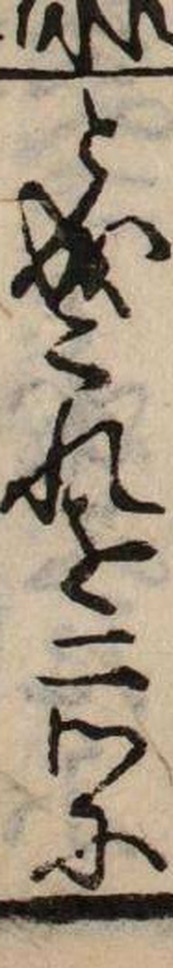と成これを二つに
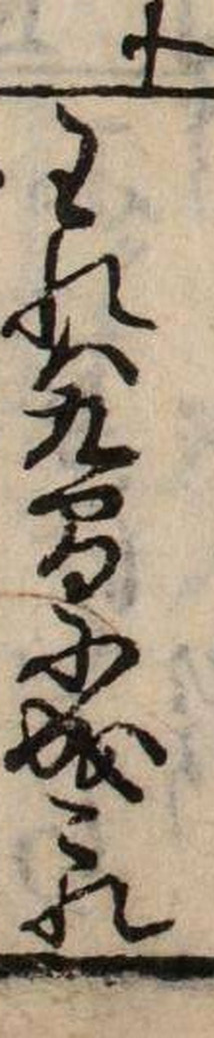われは九間に成これ
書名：塵劫記（寛永11年自跋、京都府立京都学・歴彩館追貴8）
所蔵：京都府立京都学・歴彩館 国文学研究資料館
